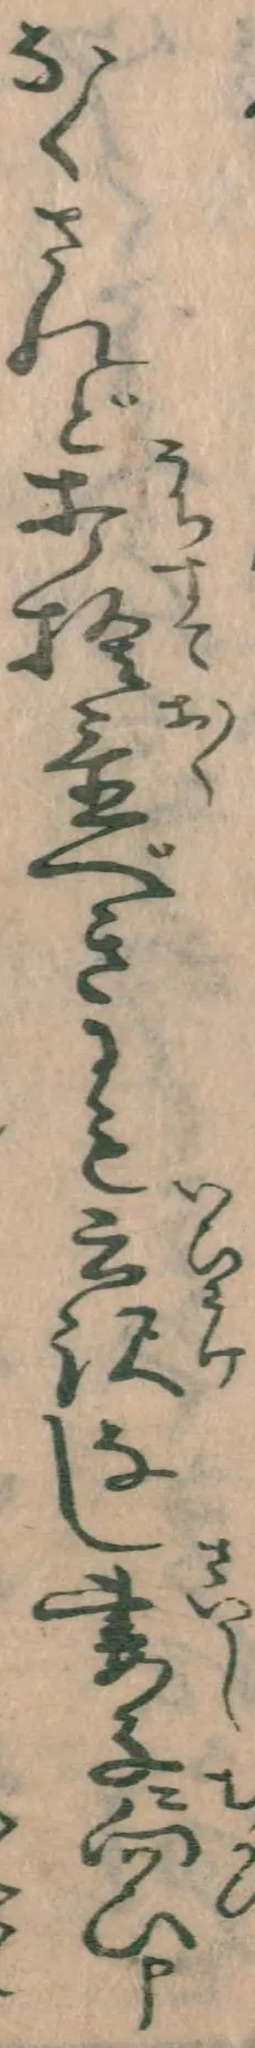なくされど打捨置べきにも言訳なし妻子向ひ申
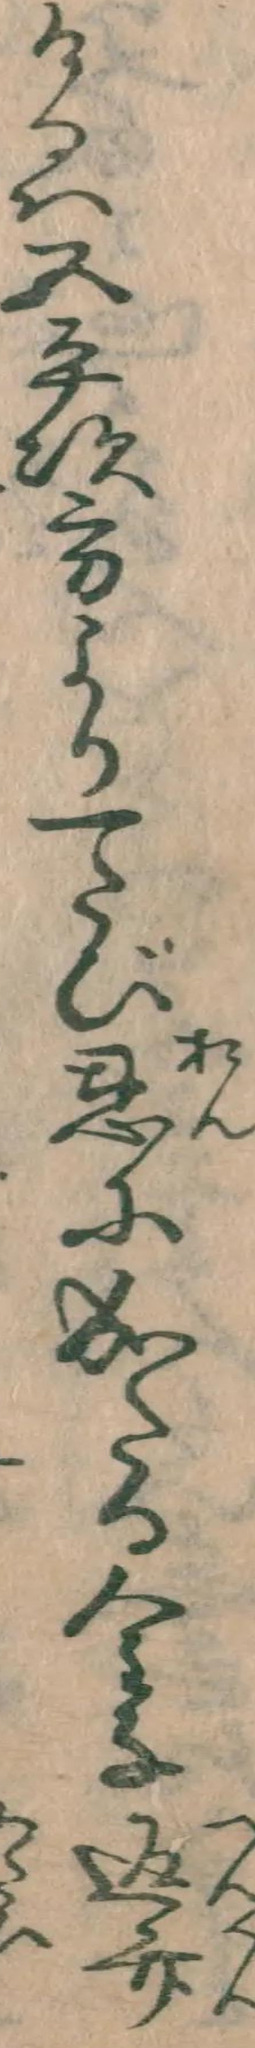けるは五平次方より一たび恩に成たる金子返弁
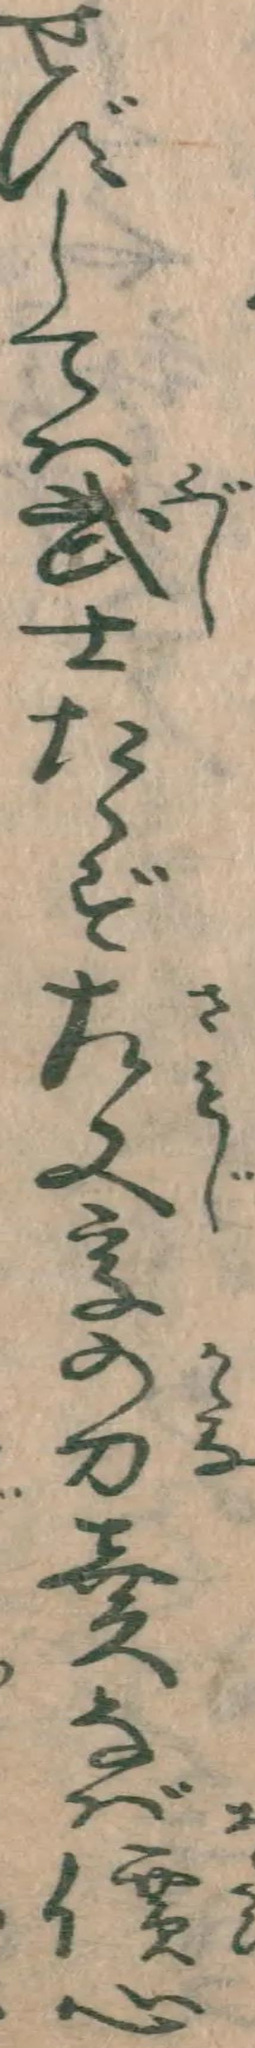せずしては武士たゝず左文字の刀売なば価心
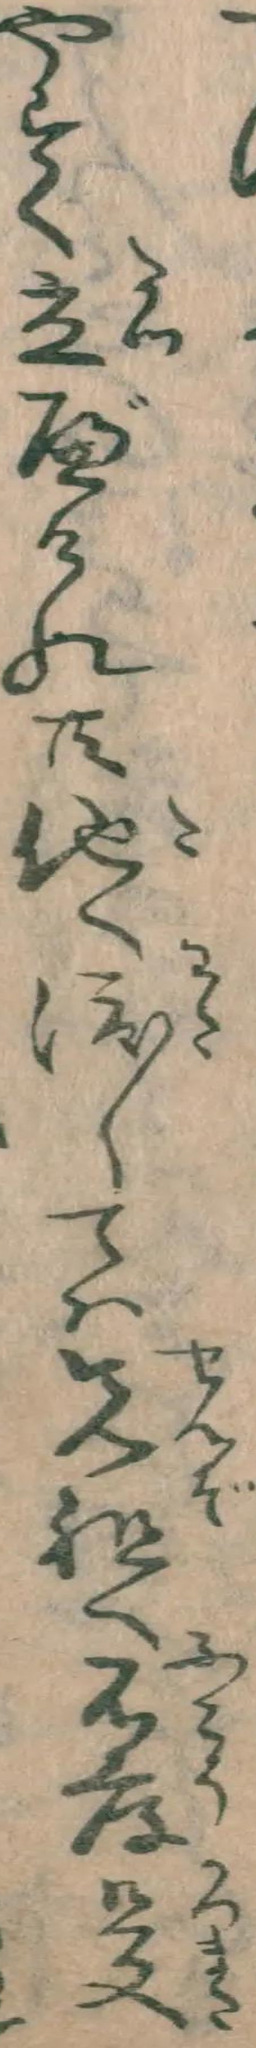やすく立べけれ共他へ渡しては先祖へ不孝且又
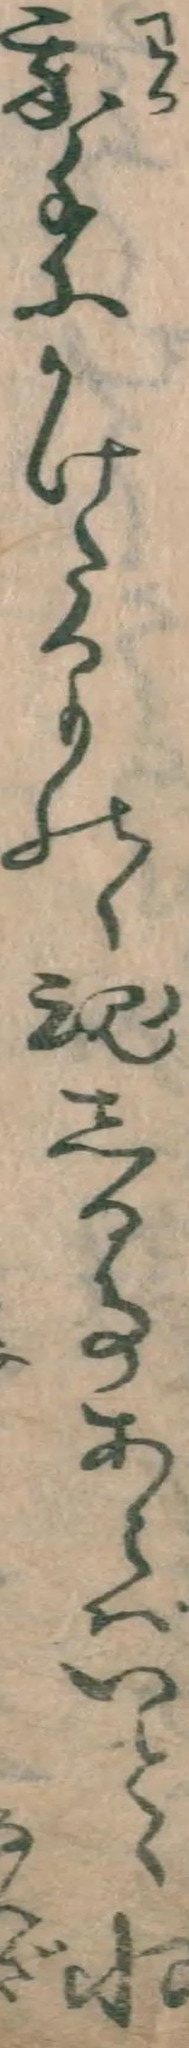我手にかけたるものゝ魂しる事あらばいとゝ恨
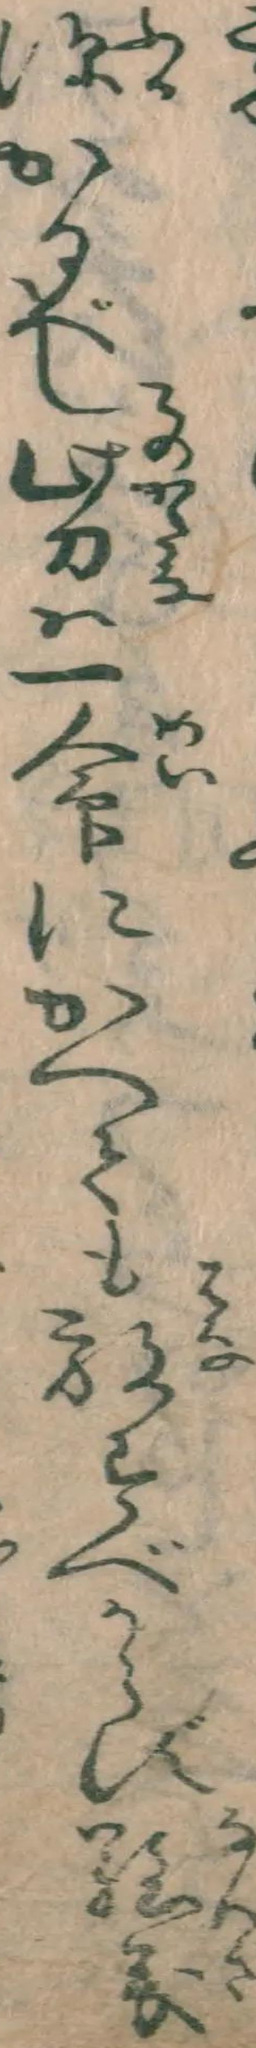深かるべし此刀は一命にかへても放すべからず難義
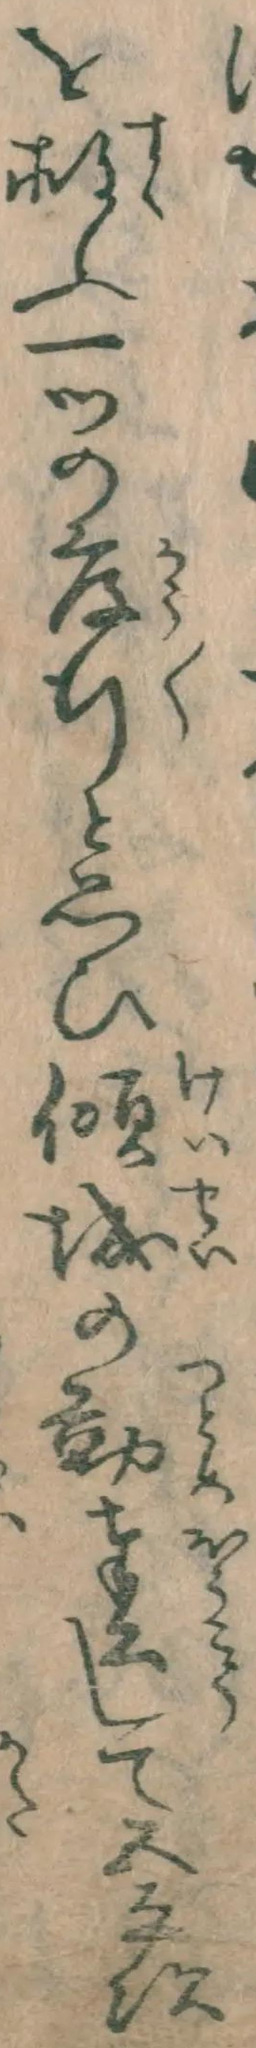を救ふ一つの孝行と思ひ傾城の勤奉公して五平次
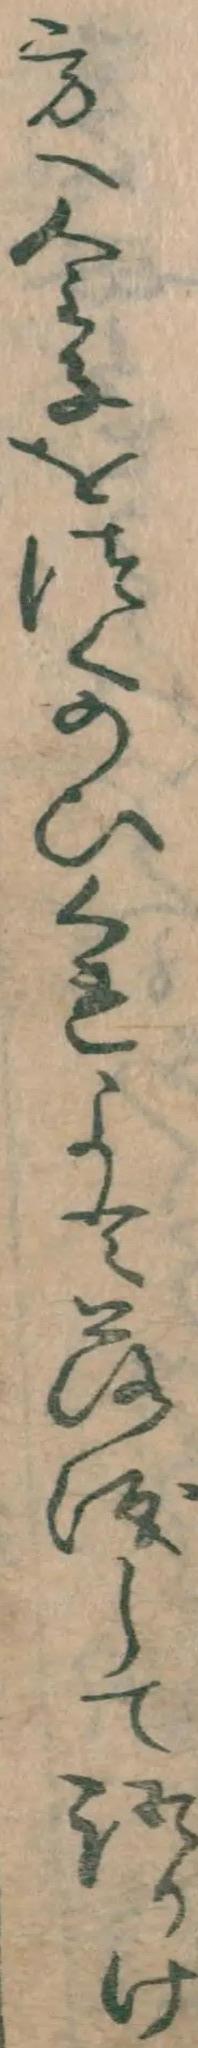方へ金子をつくのひくれよと落涙して語りけ

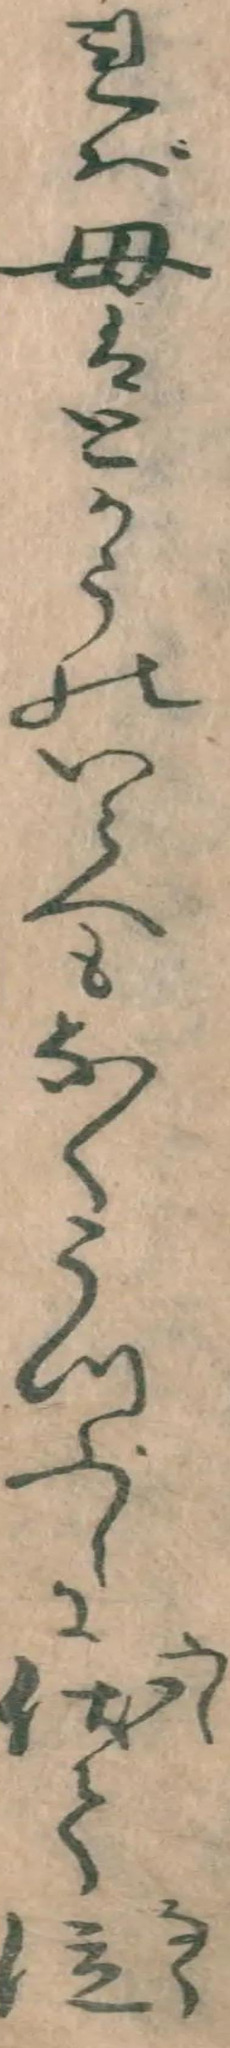れば母はとかうのいらへもなくうつふしに伏て泣
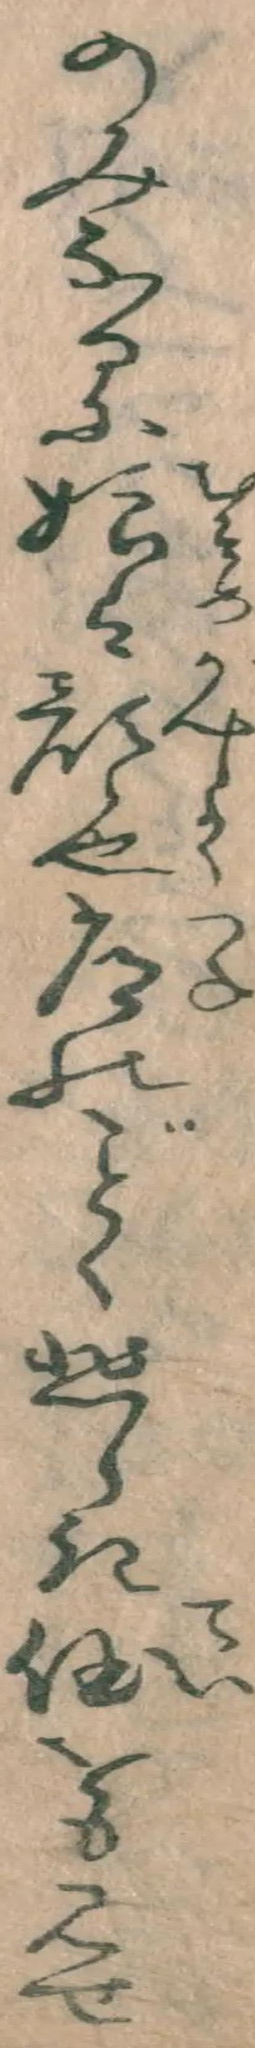のみなるに娘は顔色常のごとく悲しき体をも見せ
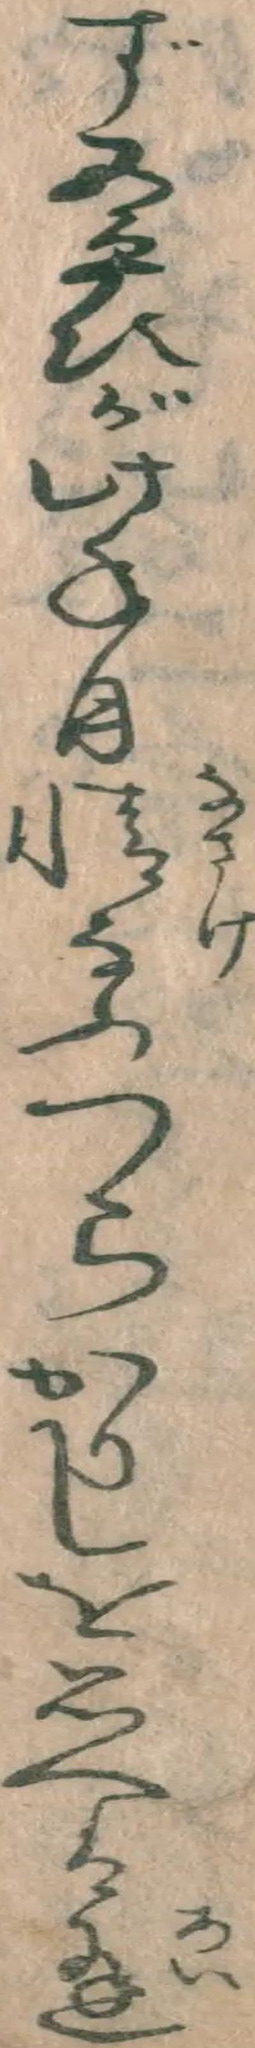ず五平次が此年月情なふつらかりしを思へは逢
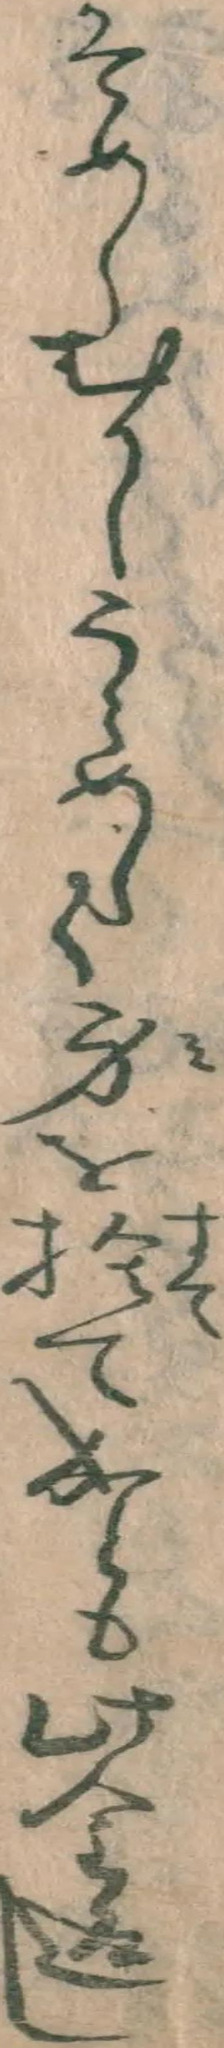そめしむかしうらめしく身を捨成とも此金返し
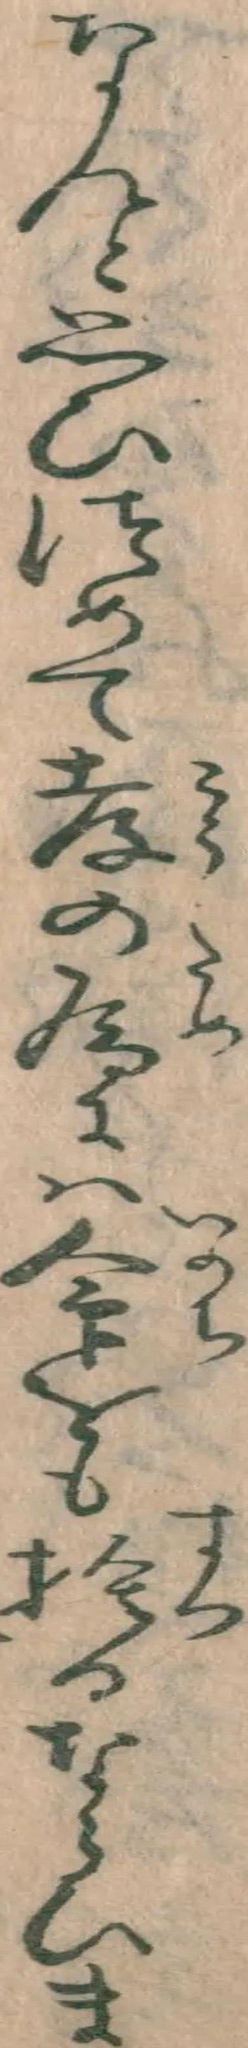なんと思ひつめて孝の為に命をも捨るならひま
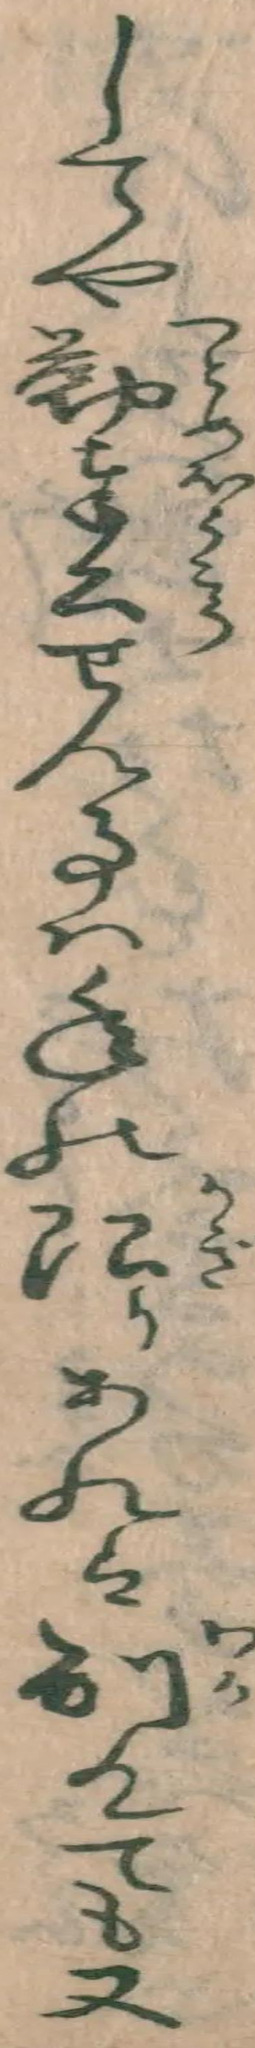してや勤奉公せん事は年の限りあれは別れても又
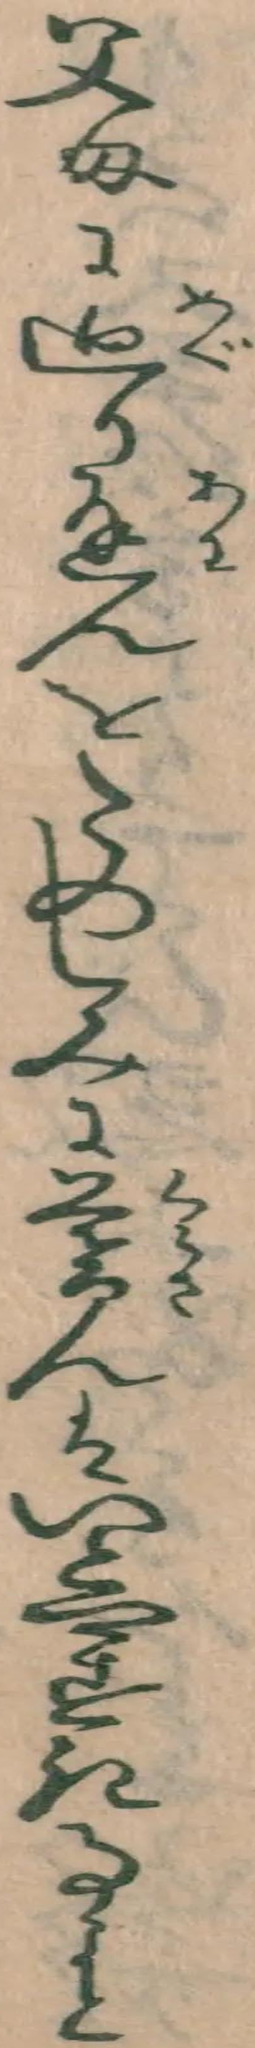父母に廻り逢んをたのしみに暮んはいとやすき事よと
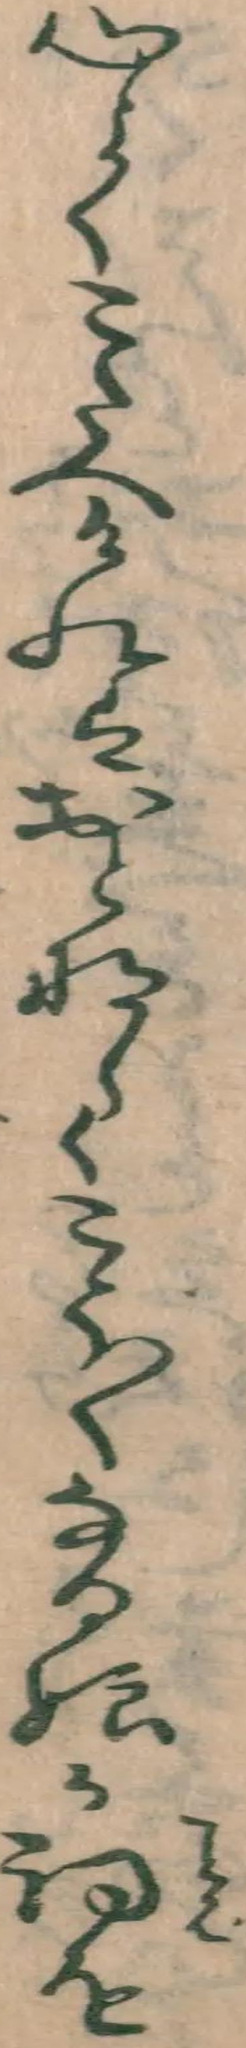心よくこたへけれはおとなしくこう〳〵なる娘か詞を
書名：怪談御伽童 5巻. [2]
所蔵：国立国会図書館 National Diet Library, JAPAN
